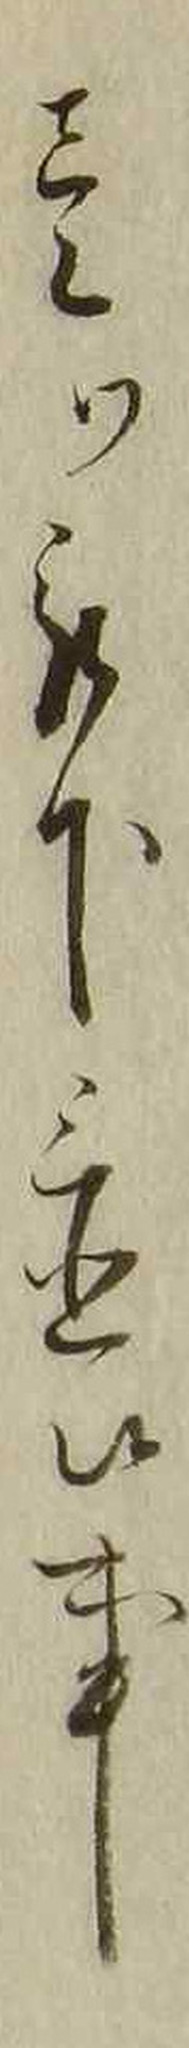壱ツ被下置候事
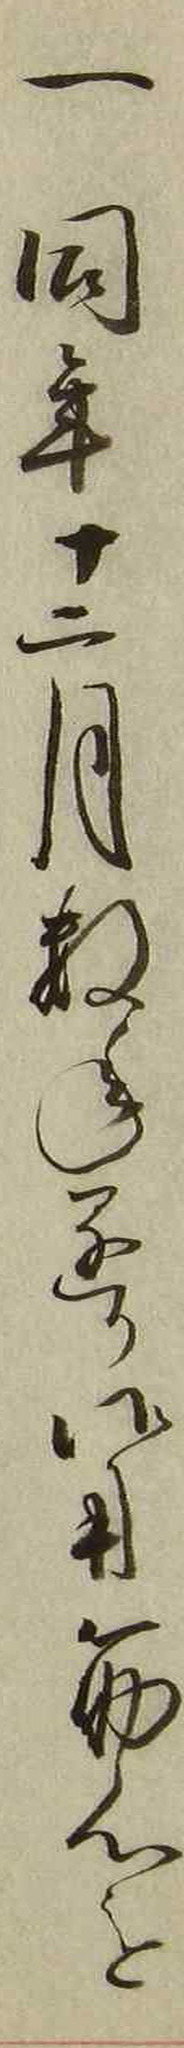一同年十二月数年懸り御用筋心を
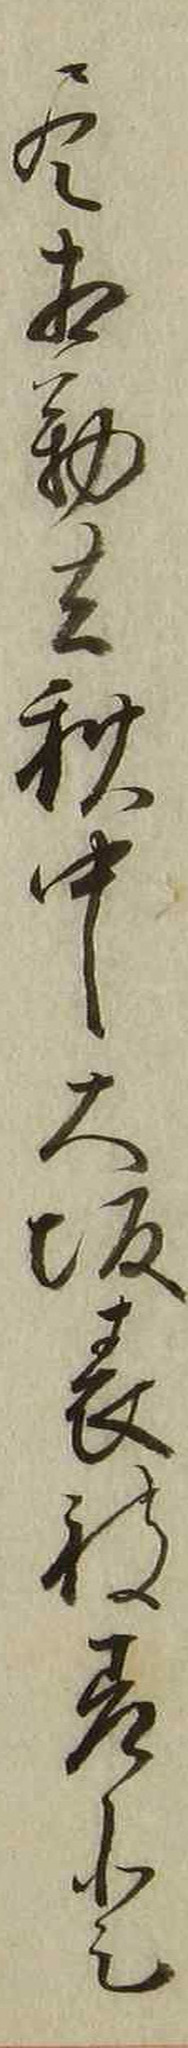尽相勤去秋中大坂表被差登
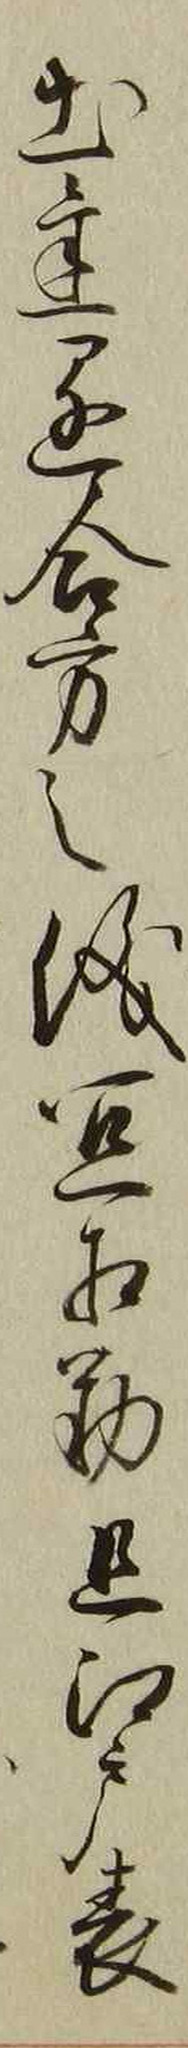出金懸合方之儀宜相勤且江戸表
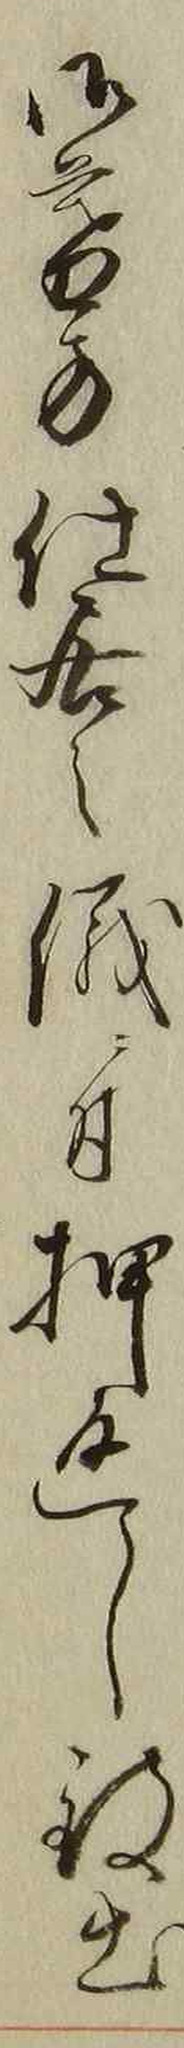御暮方仕居之儀ニ付押返し致出
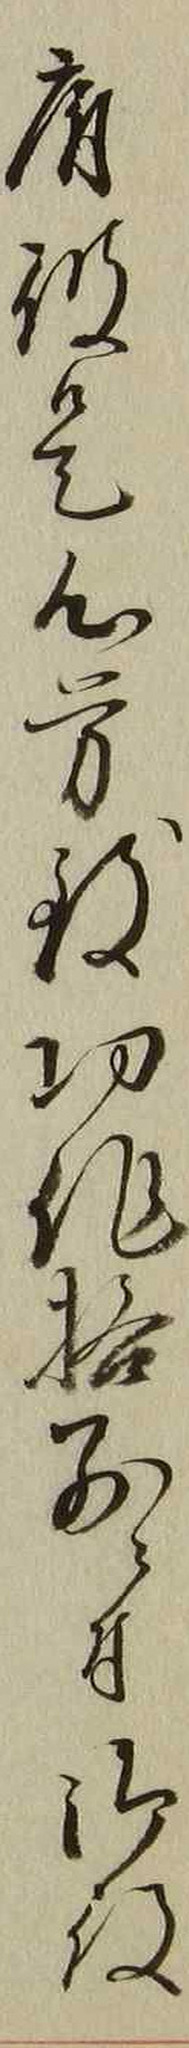府彼是心労致功作格別ニ付御役
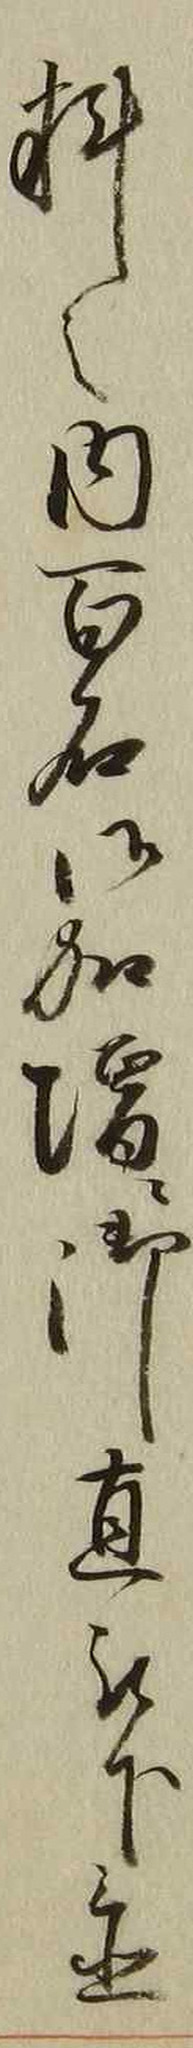料之内百石御加増ニ御直被下置
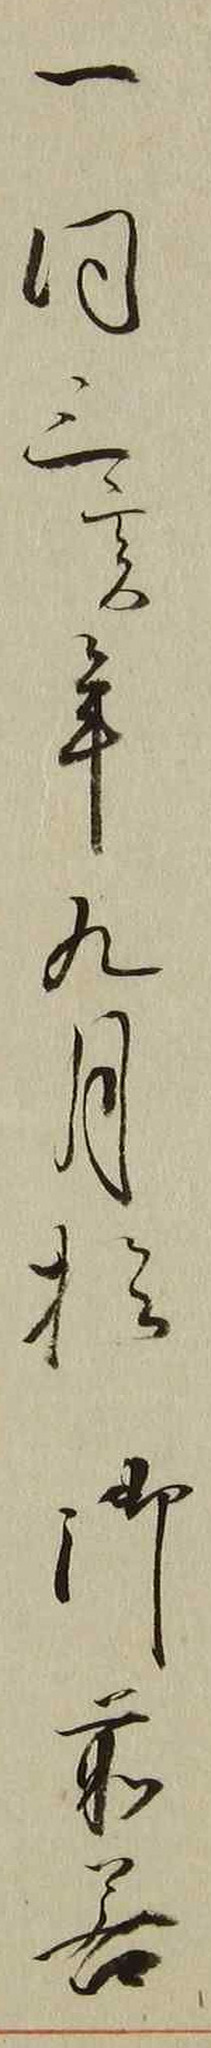一同三亥年九月於御前若
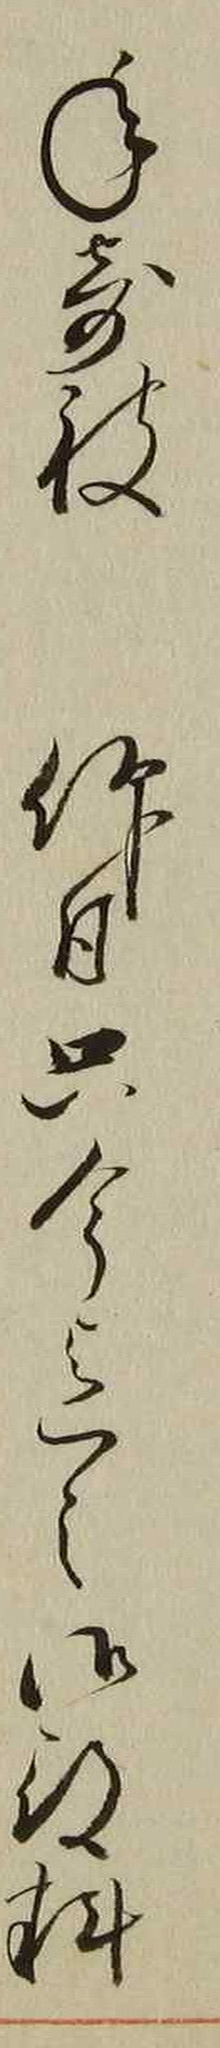年寄被仰付只今迄之御役料
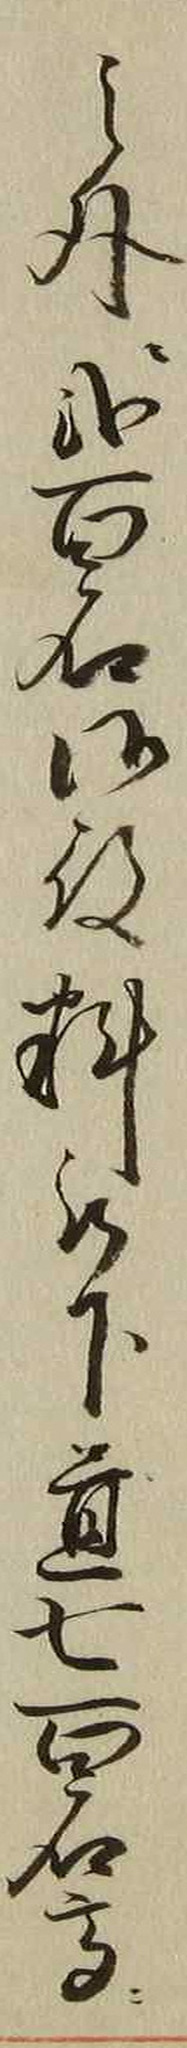之外ニ弐百石御役料被下置七百石高ニ
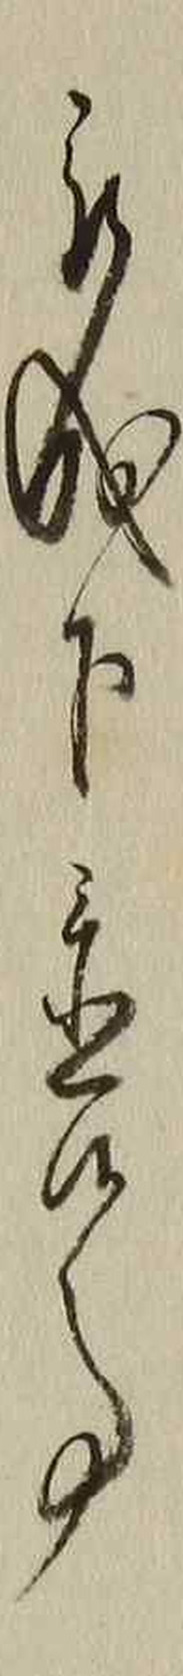被成下置候事
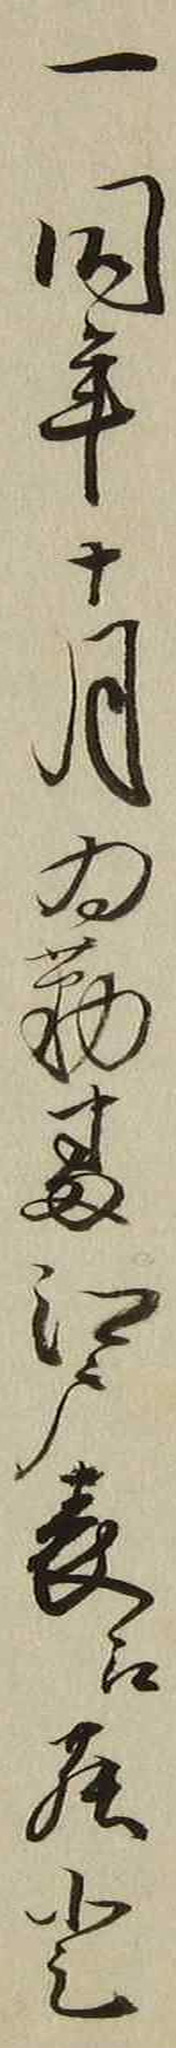一同年十月為勤番江戸表江罷登
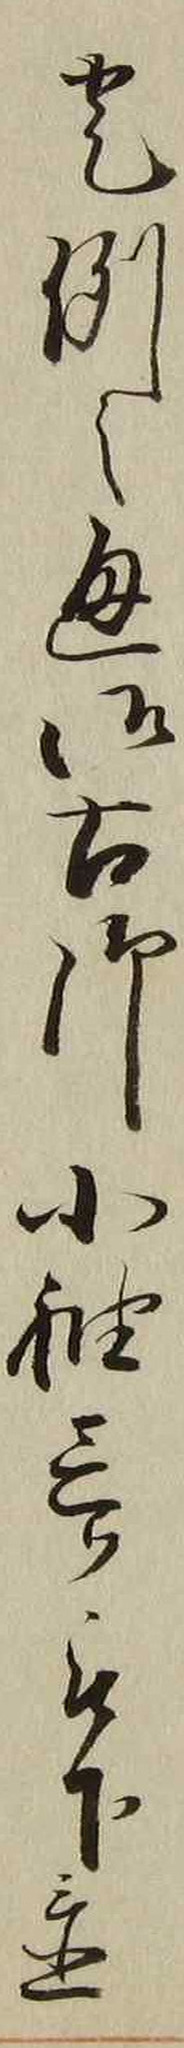登例之通御古御小袖壱ツ被下置
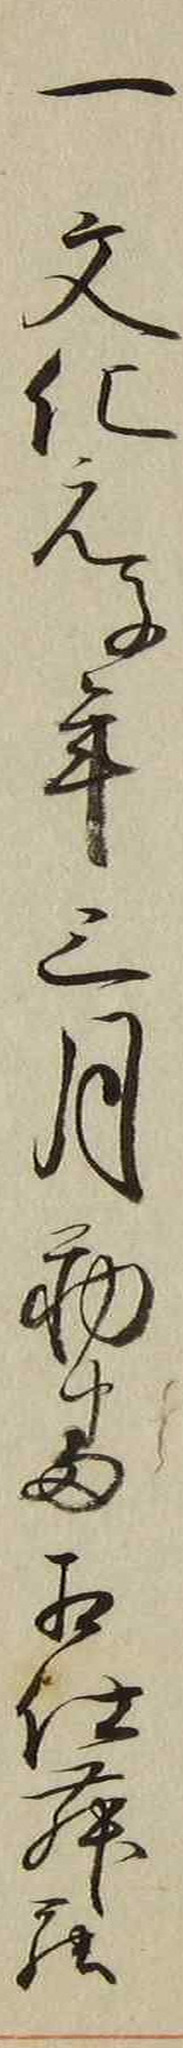一文化元子年三月勤番相仕舞罷
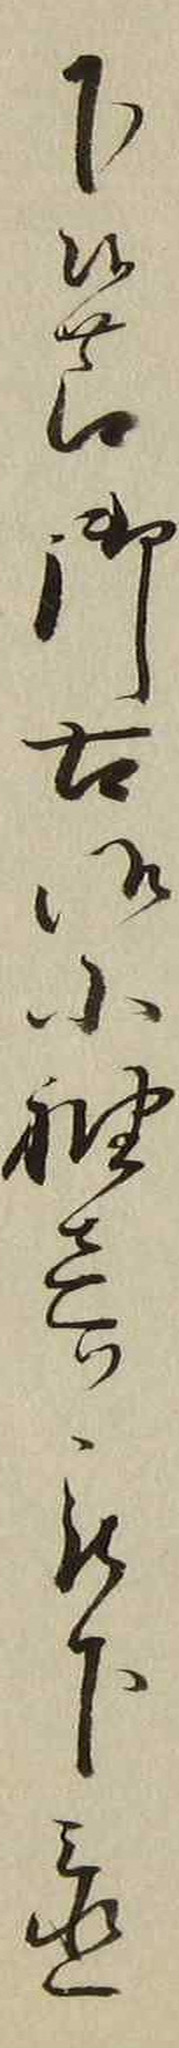下候節御古御小袖壱ツ被下置
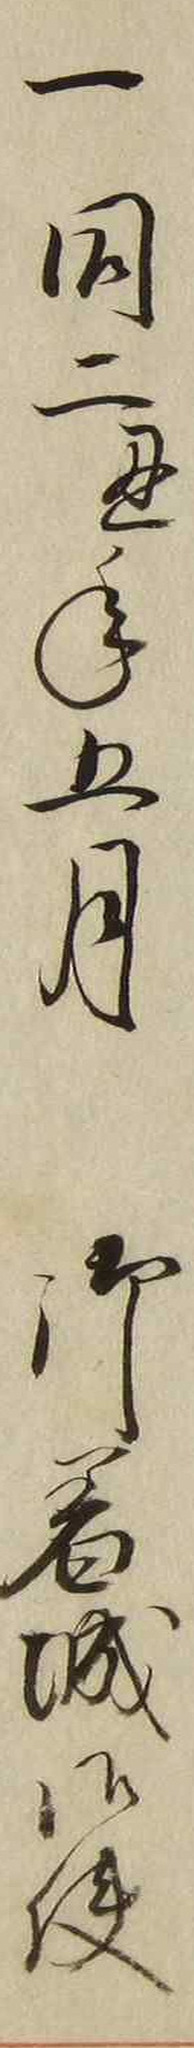一同二丑年五月御着城御使
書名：諸士系譜　巻之2　い之部2
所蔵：会津若松市立会津図書館
